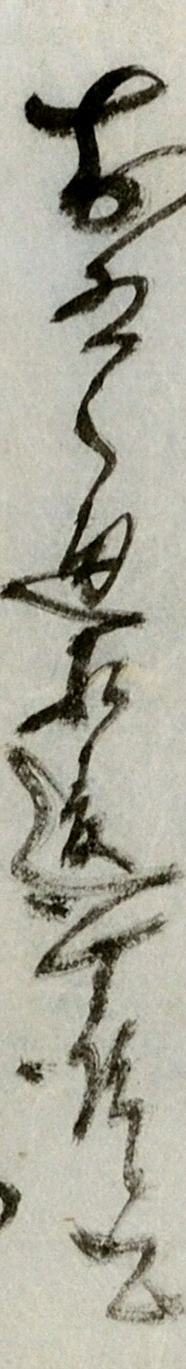前書之通相違無御座候以上
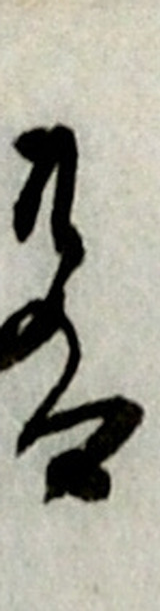廿九日
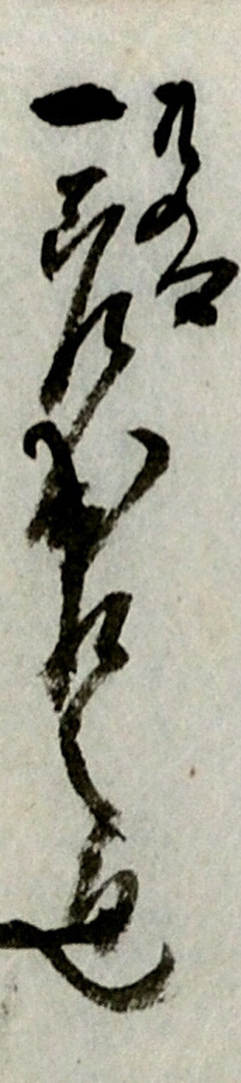一差出左之通
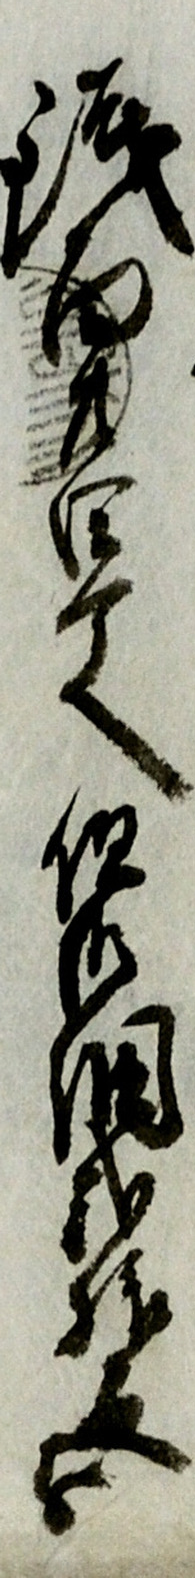銭百廿四文但御網弐拾反分
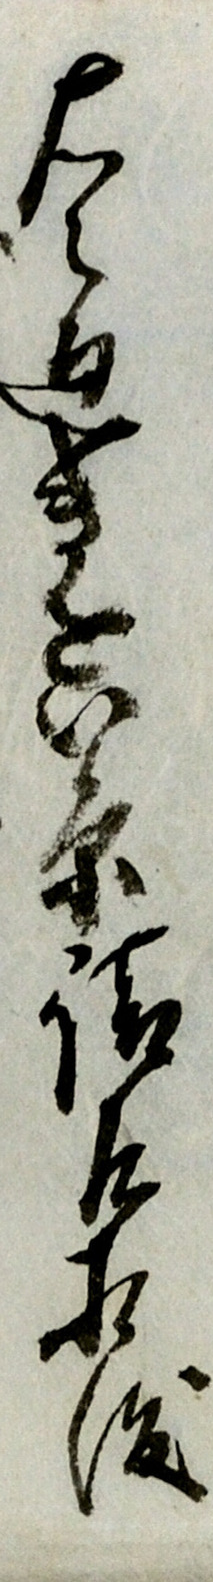右之通きをい糸請取相渡
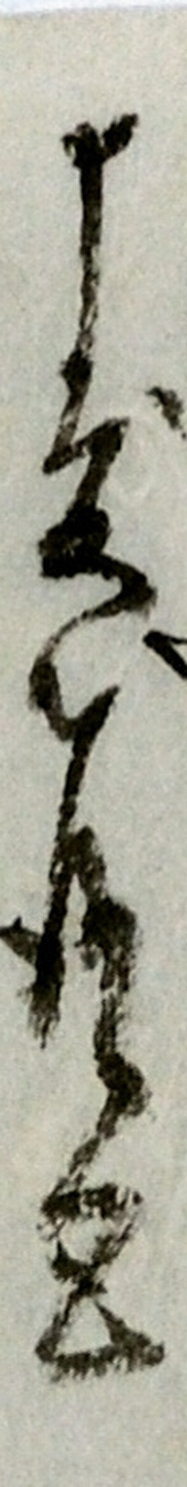申度奉存候以上
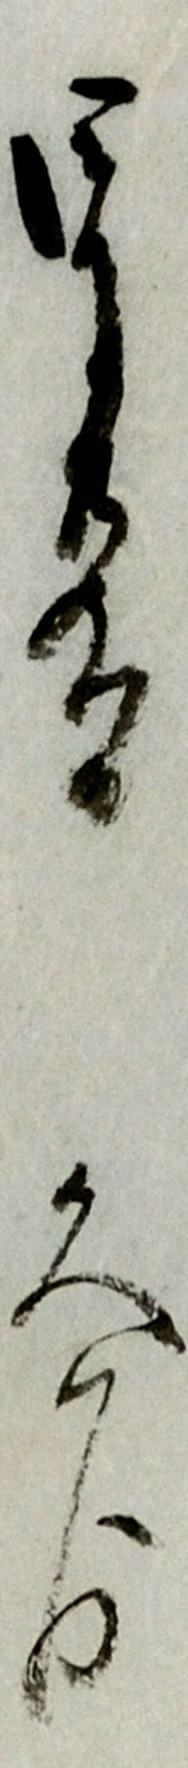四月廿九日久左衛門
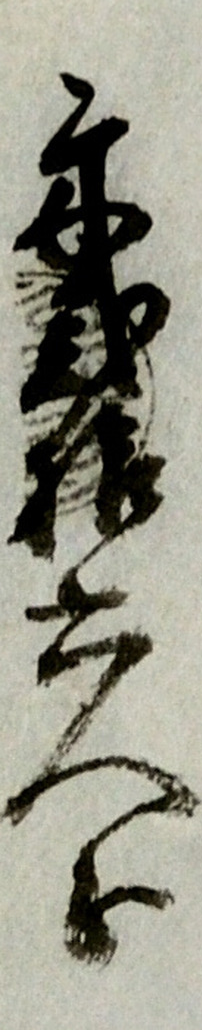米弐拾六人分
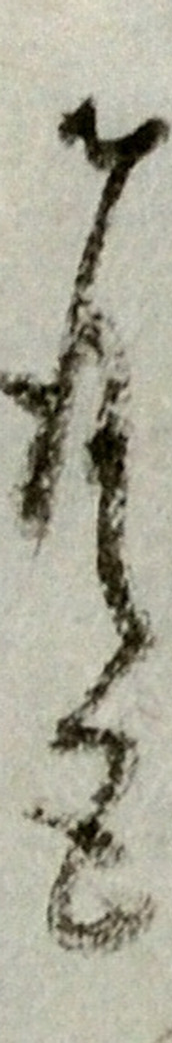奉存候以上
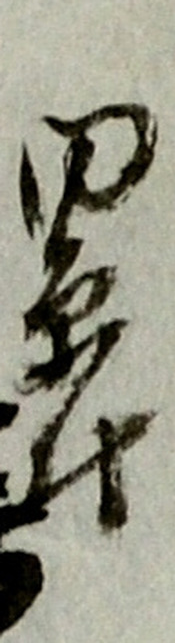田原村
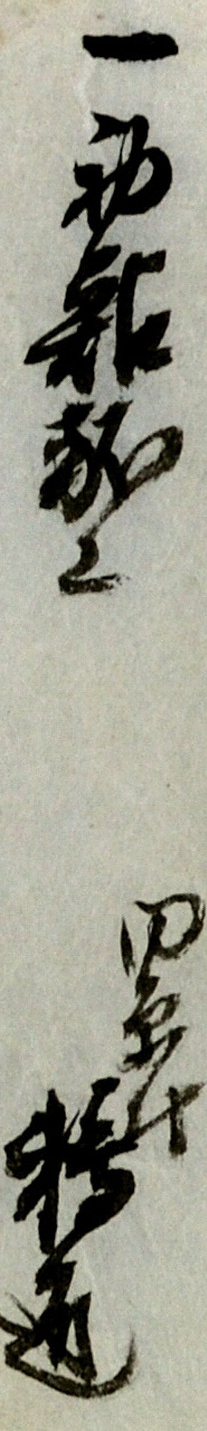一初鮎献上鵜匠

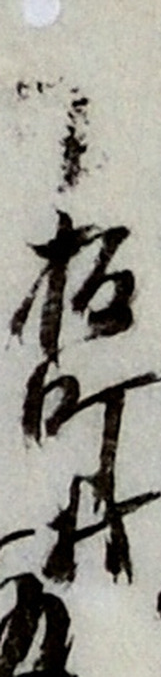板町村
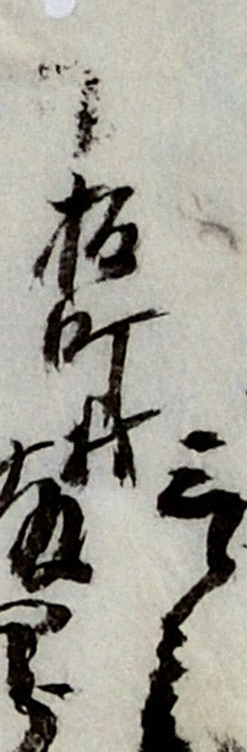板町村
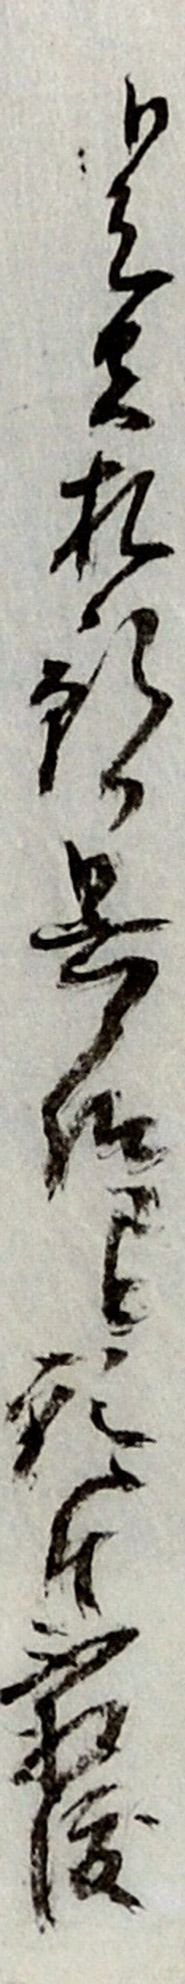是は札預り呉候様ニと願ニ付不相渡
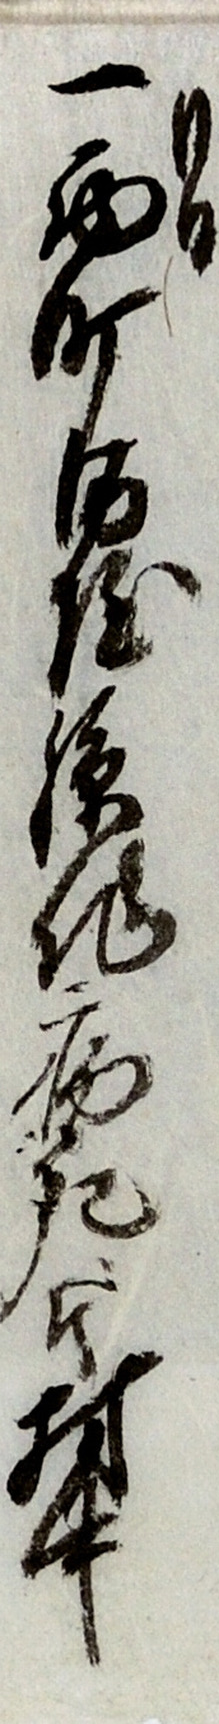一西町酒屋孫作病死ニ付村中
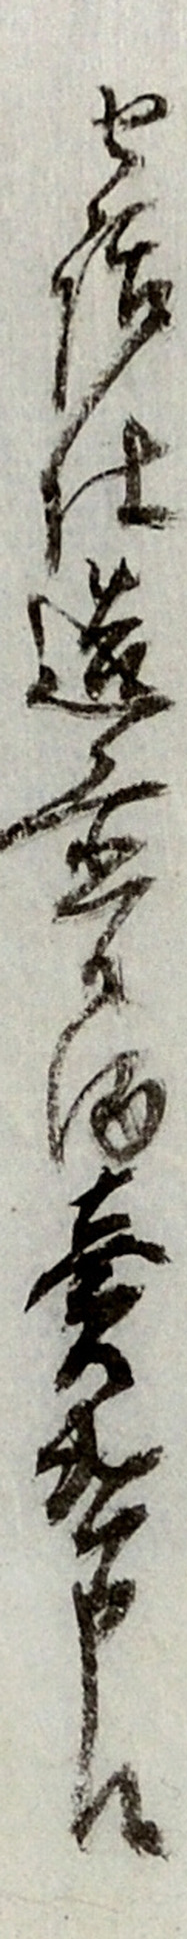世話仕造置候酒売遣申候
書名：分一方諸事御用留帳
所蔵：伊那市立高遠町図書館・合同会社AMANE
